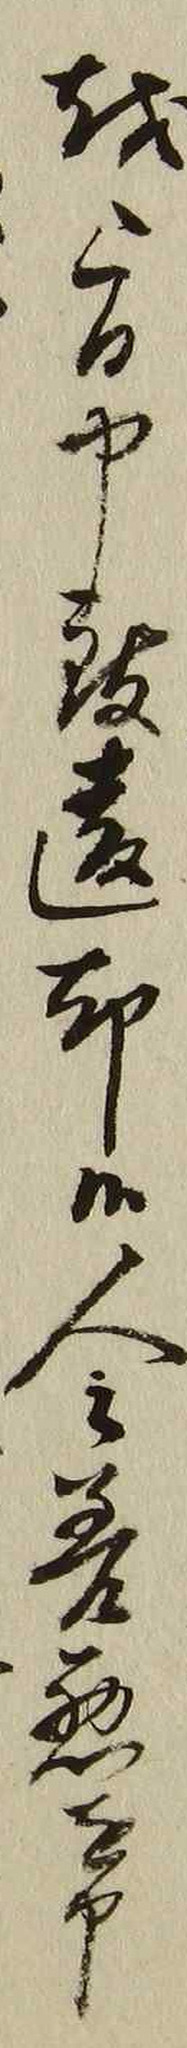越旨申致違却候人之善悪を申
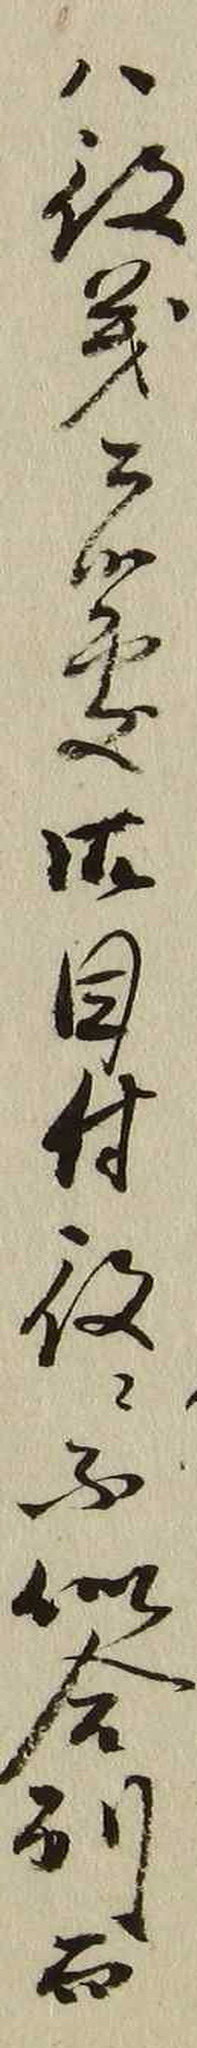ハ役義ニ候処御目付役ニ不似合別而
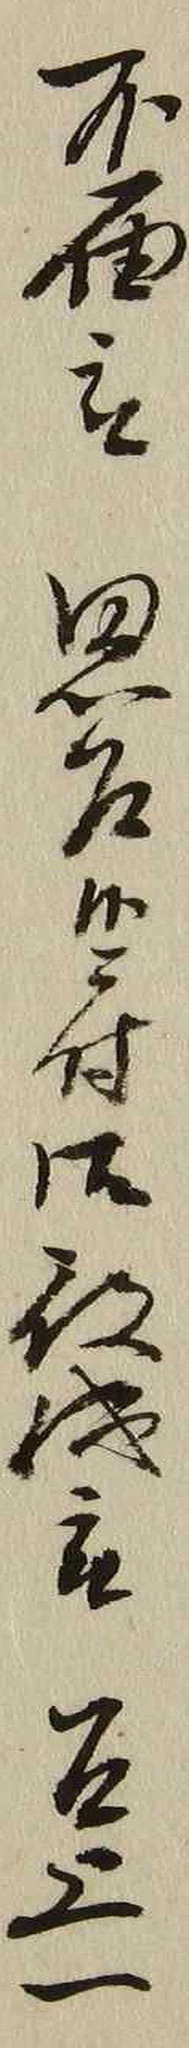不届被思召候ニ付御役儀被召上一
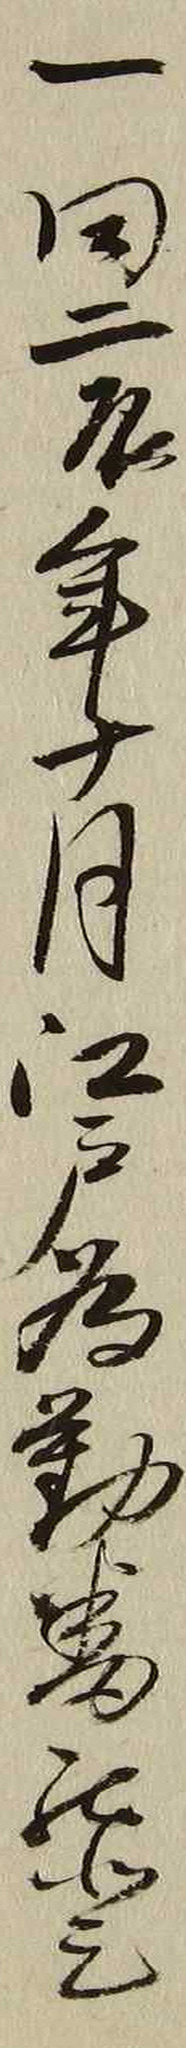一同二辰年十月江戸為勤番罷登
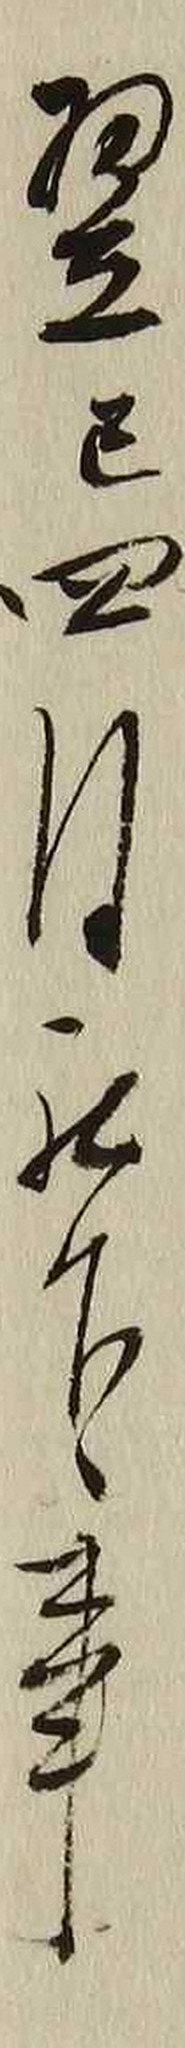翌巳四月罷下候事
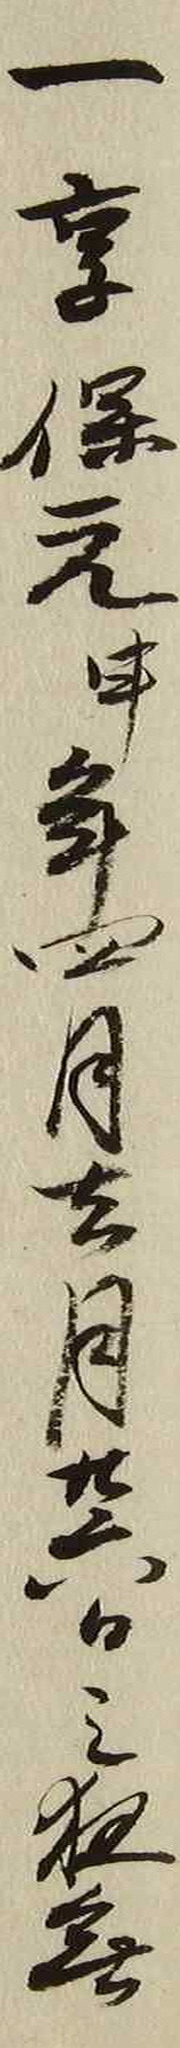一享保元申年四月去月廿六日之夜無
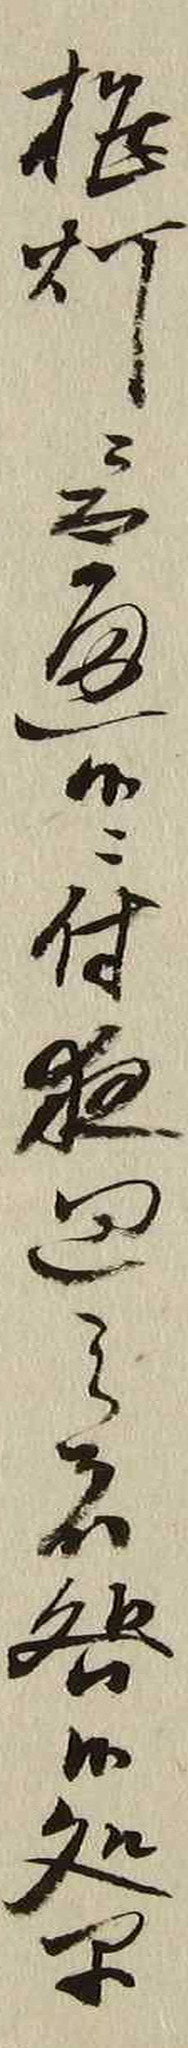挑灯ニ而通候ニ付夜廻之者咎候処早
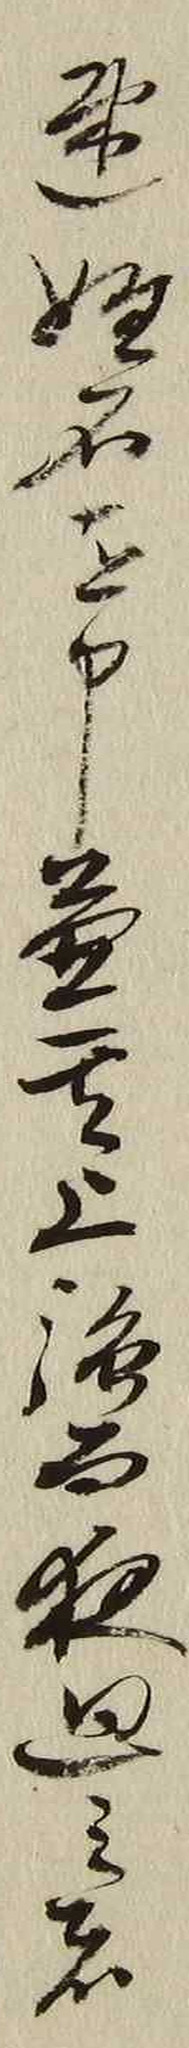速姓名を申兼其上強而夜廻之者
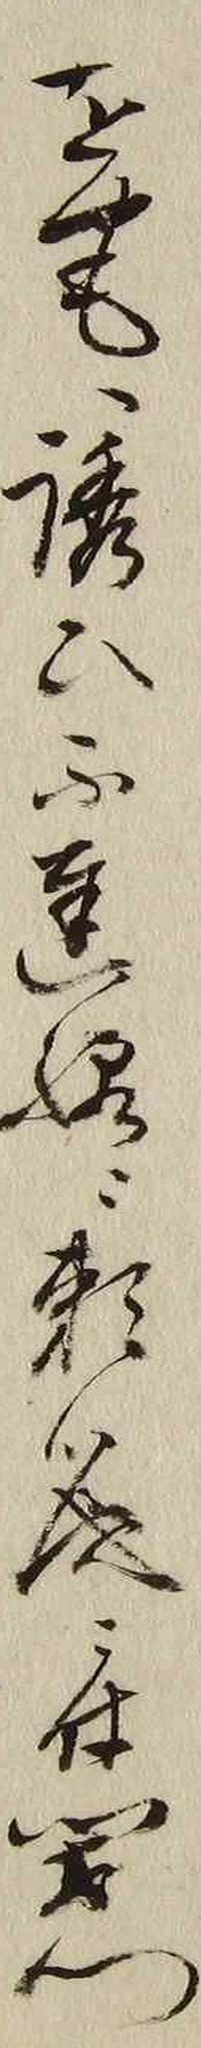を宅へ誘ひ不達様ニ頼候儀ニ付閉門
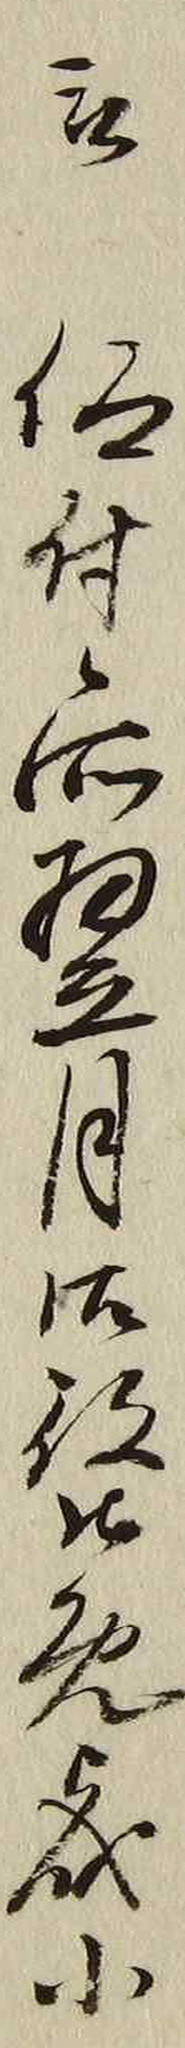被仰付候処翌月御役御免被成小
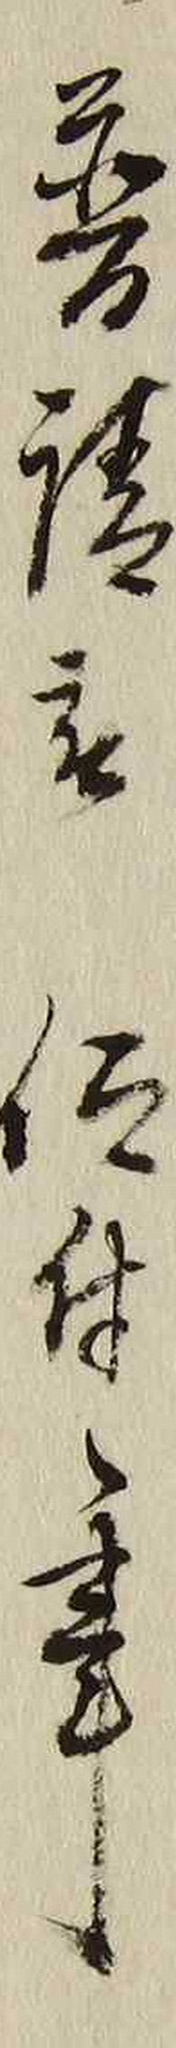普請被仰付候事
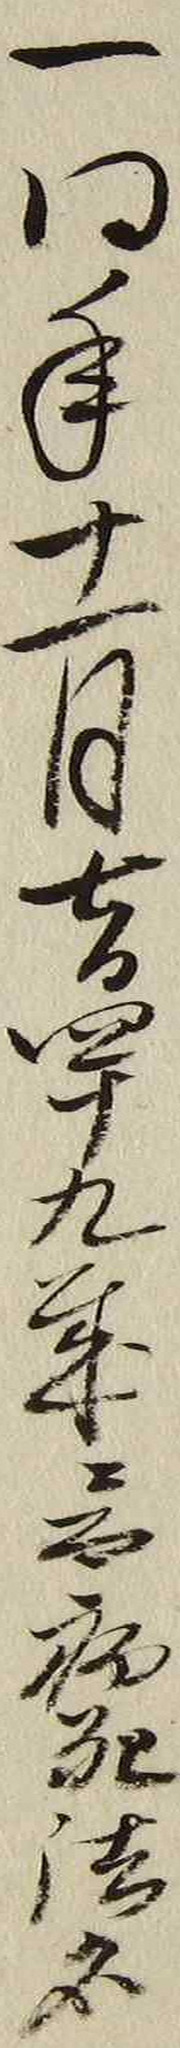一同年十一月七日四十九歳ニ而病死法名
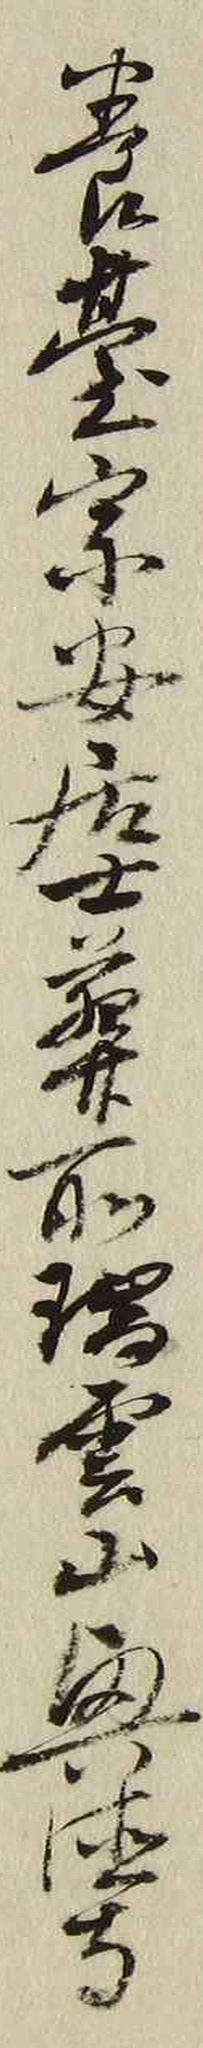養台宗安居士葬所瑞雲山興徳寺
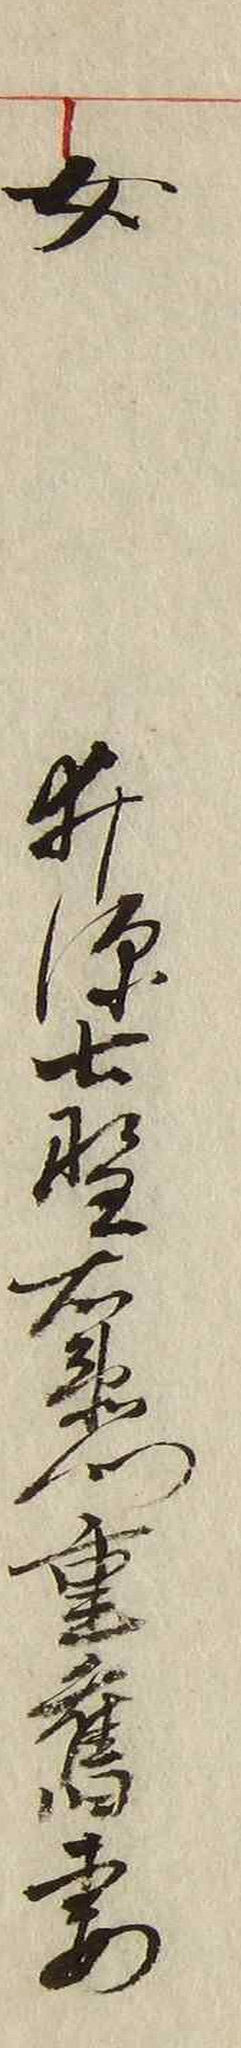女井深七野右衛門重旧妻
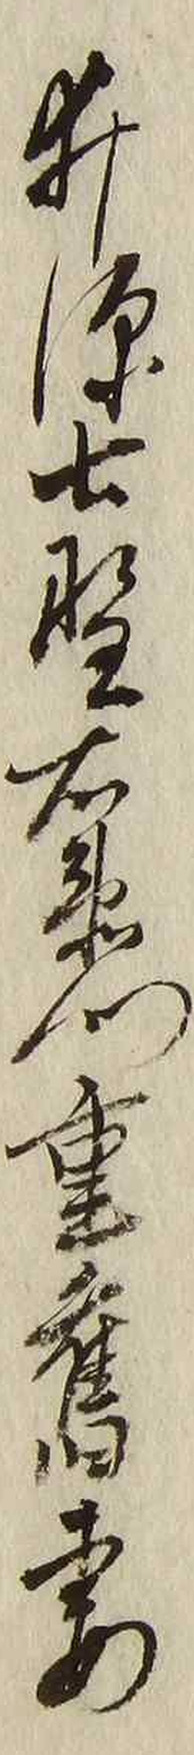女井深七野右衛門重旧妻

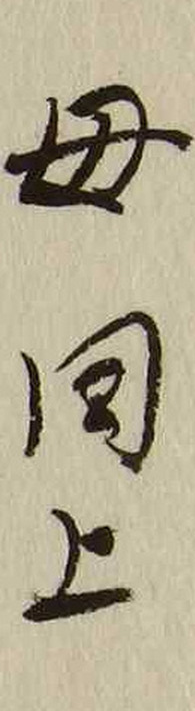母同上
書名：諸士系譜　巻之352　す之部2
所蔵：会津若松市立会津図書館
